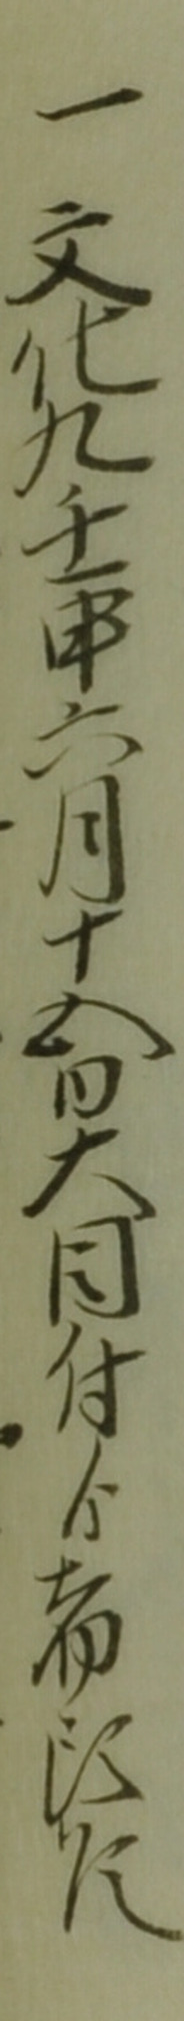一文化九壬申六月十五日大目付ゟ者頭次
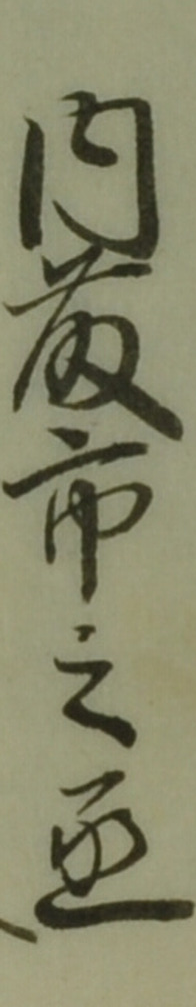内藤市之丞
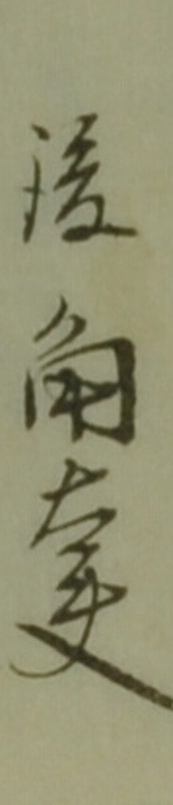後角太夫
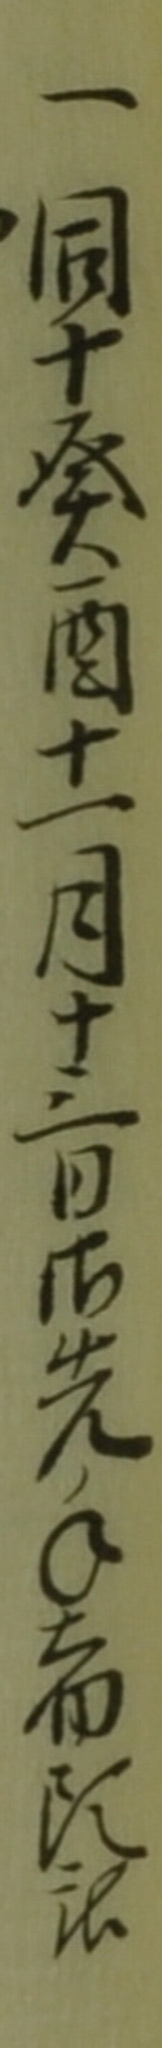一同十癸酉十一月十三日御先手者頭被
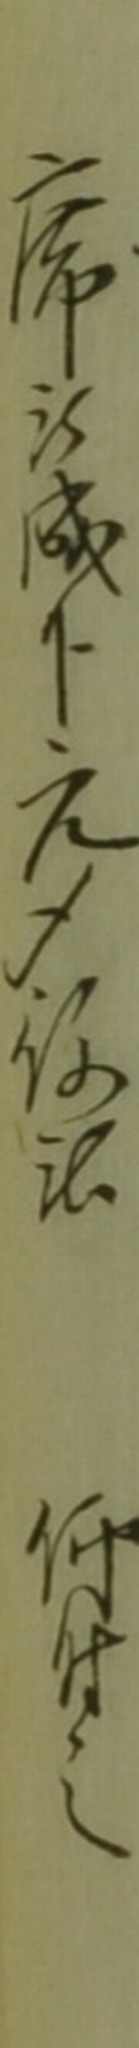席被成下元〆役被仰付之
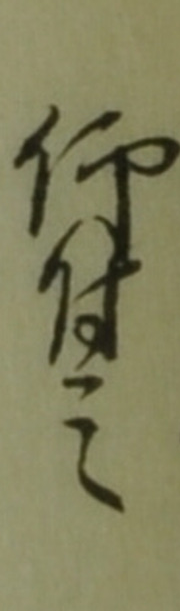仰付之
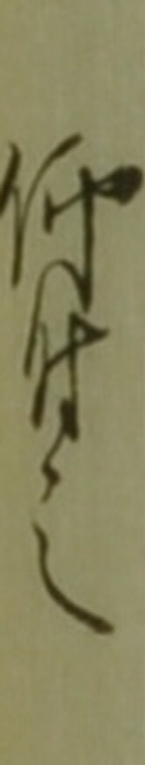仰付之
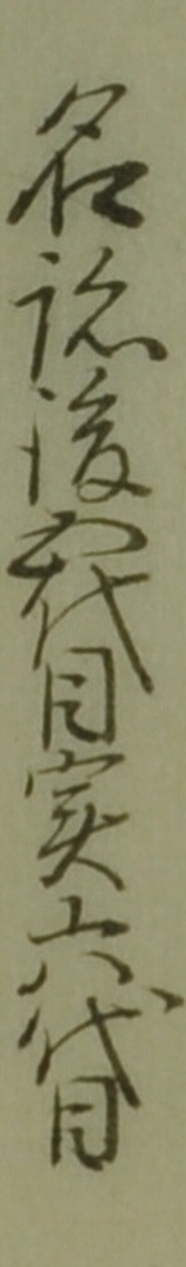名跡後五代目実六代目
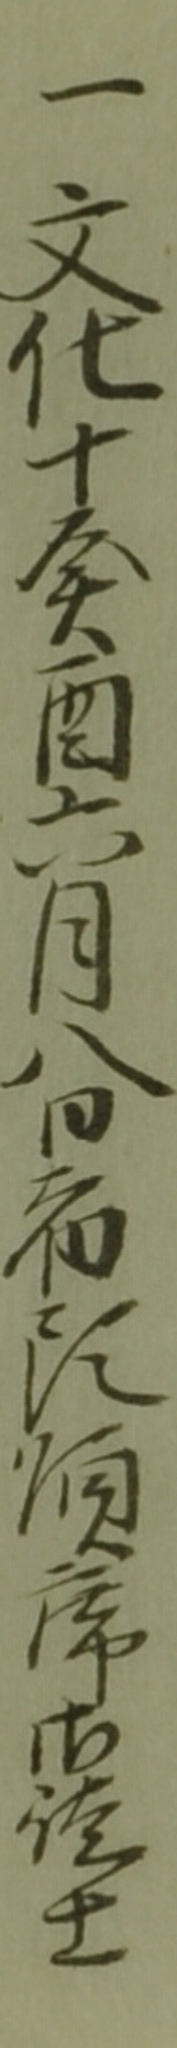一文化十癸酉六月八日者頭順席御徒士
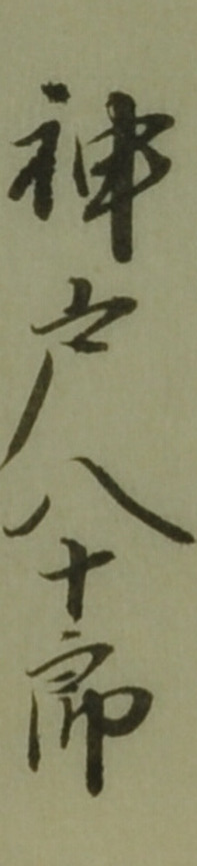神戸八十郎
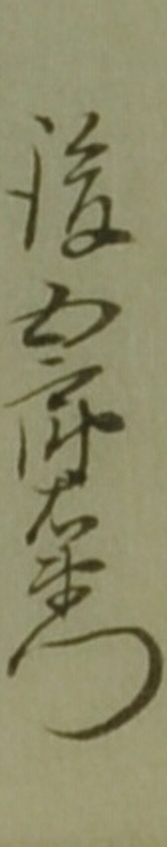後五郎右衛門
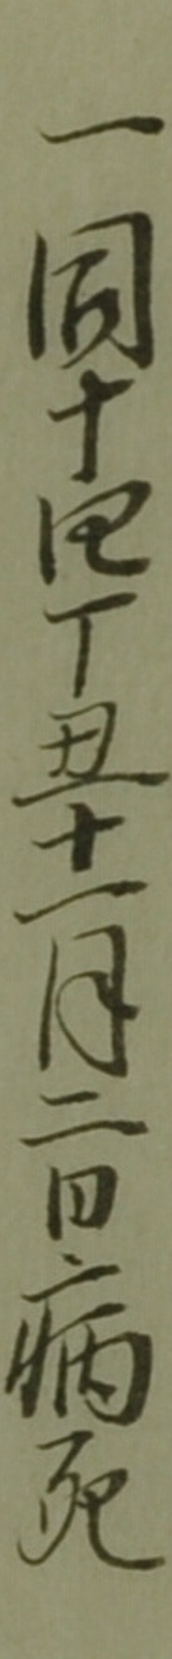一同十四丁丑十一月二日病死
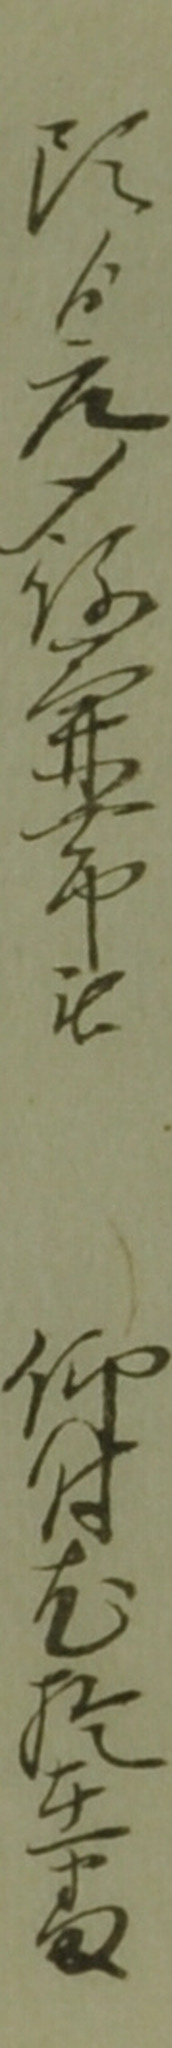頭ゟ元〆役兼帯被仰付尤於在番
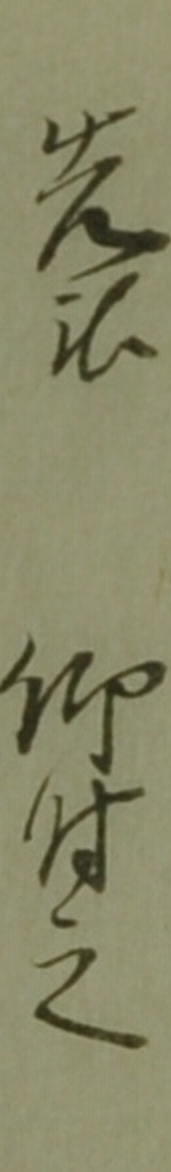先被仰付之
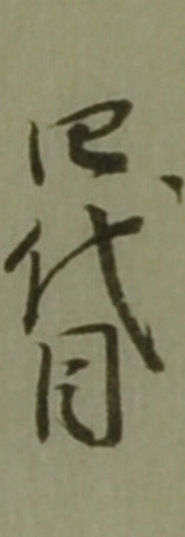四代目
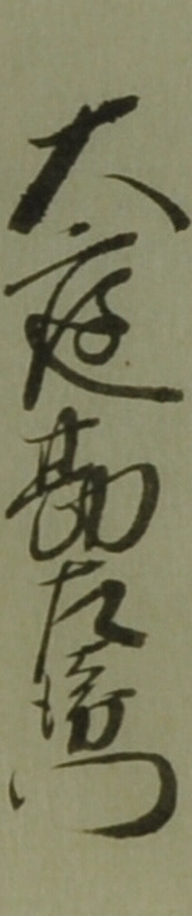大庭勘左衛門
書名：諸御役代々録（七）
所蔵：伊那市立高遠町図書館・合同会社AMANE
